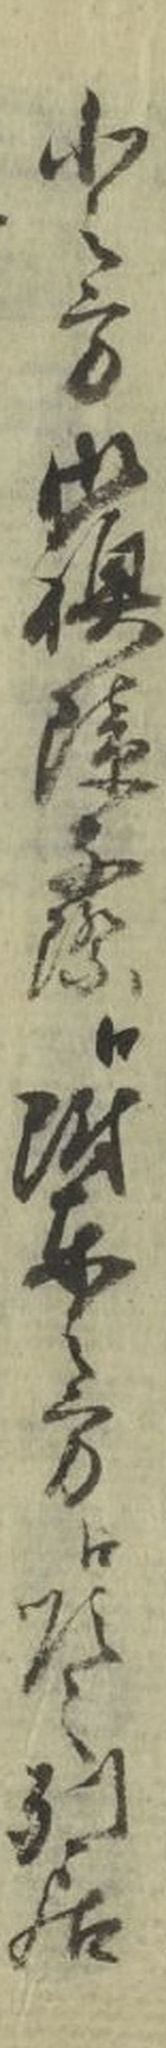北之方御襖障子際え附東之方え順々列居
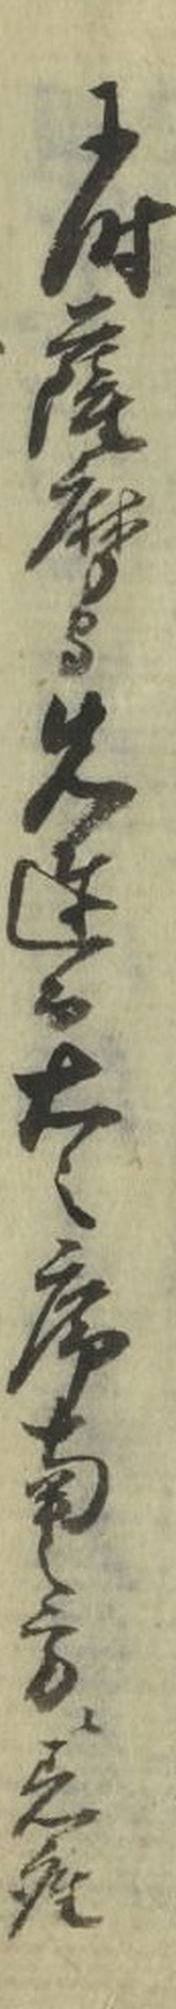于時薩摩守先達て右之席南之方に着座
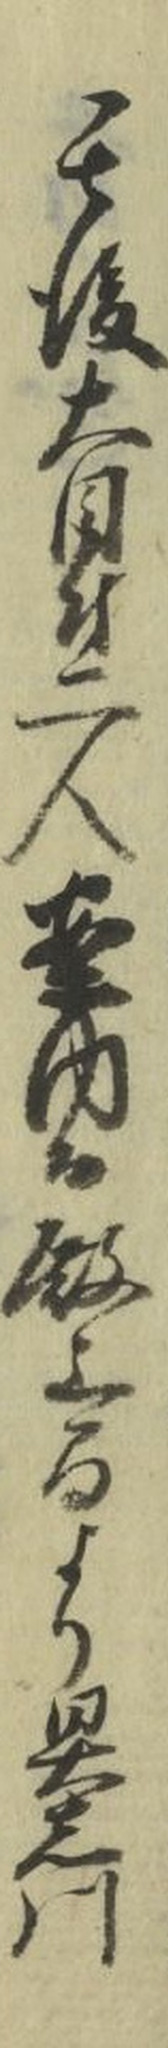其後大目付二人案内而殿上間より具志川
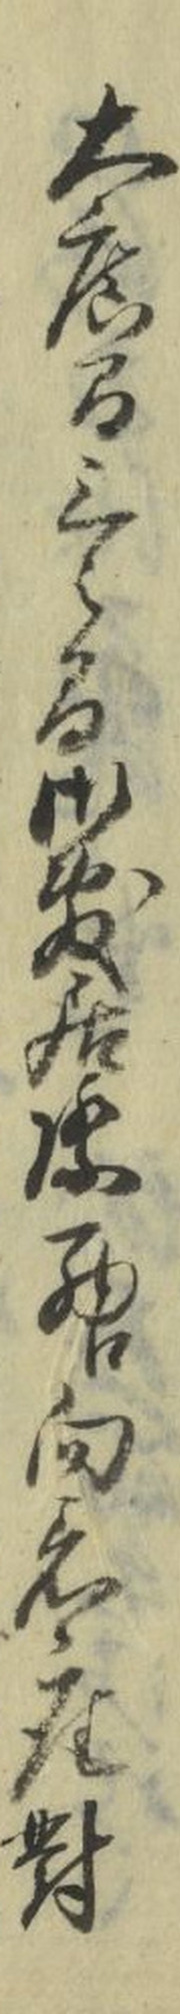大広間三之間御敷居際西え向着座対
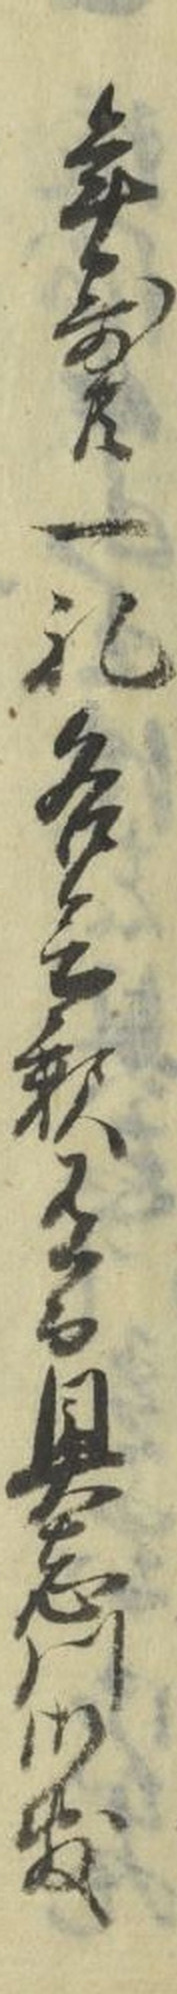年寄共一礼各会釈有て具志川御敷
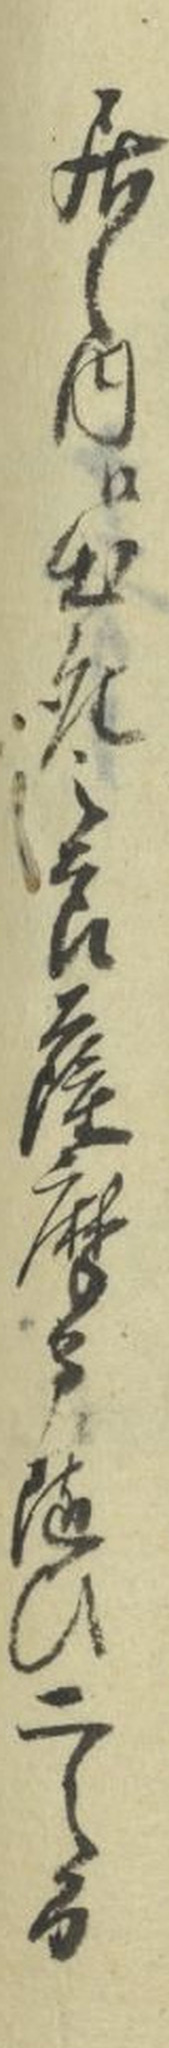居之内え出座之節薩摩守随ひ二之間
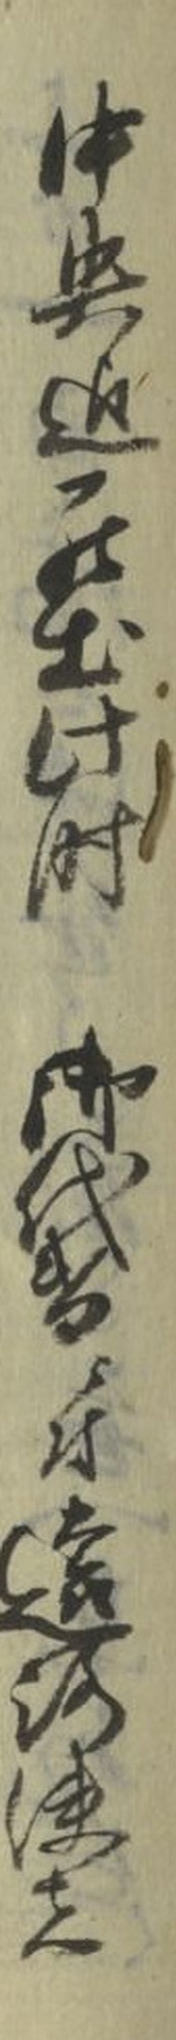中央迄罷出此時御代替に付遠路使者
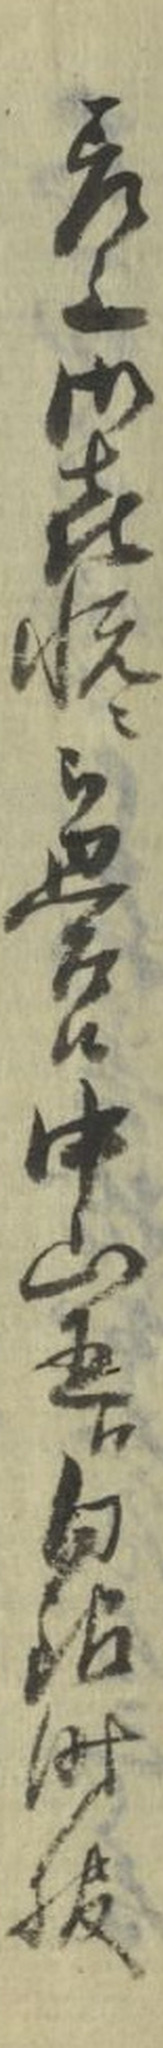差上御喜悦に被思召候中山王え白銀時服
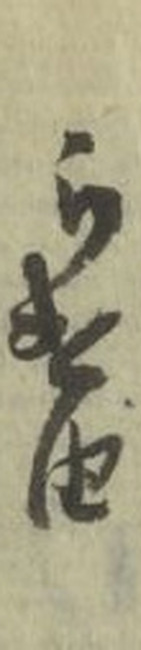被遣由
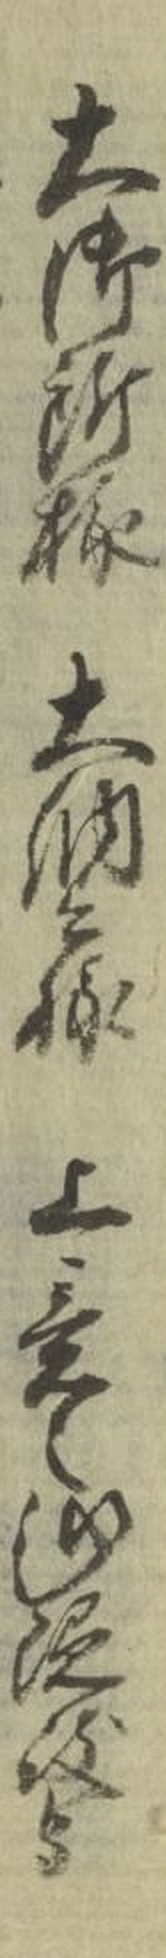大御所様大納言様上意之趣隠岐守
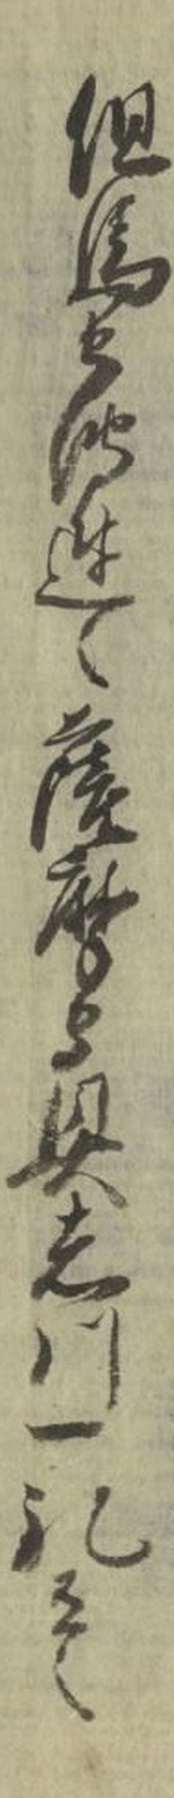但馬守伝達之薩摩守具志川一礼有之
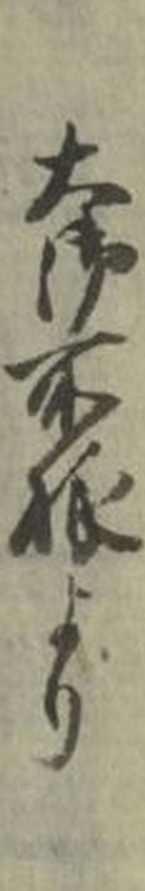大御所様より
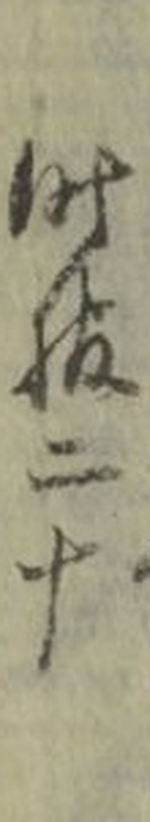時服二十
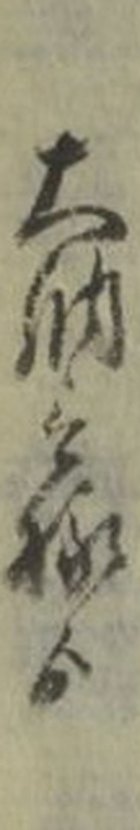大納言様ゟ
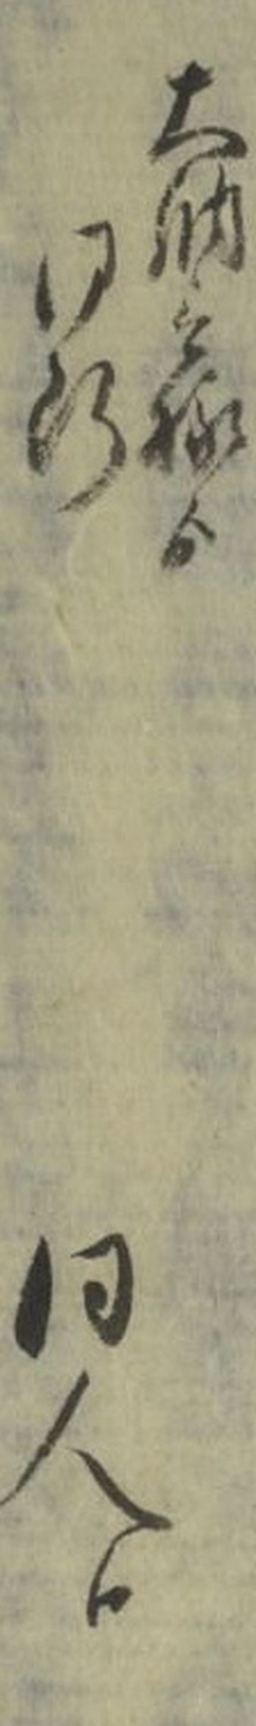同断同人え

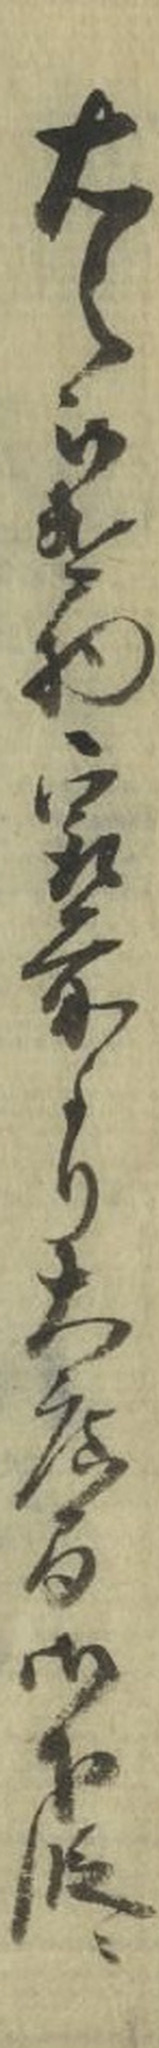右之被遣物最前より大広間御下段に
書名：戊辰琉球人来朝之式 全
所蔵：University of the Ryukyus Library
